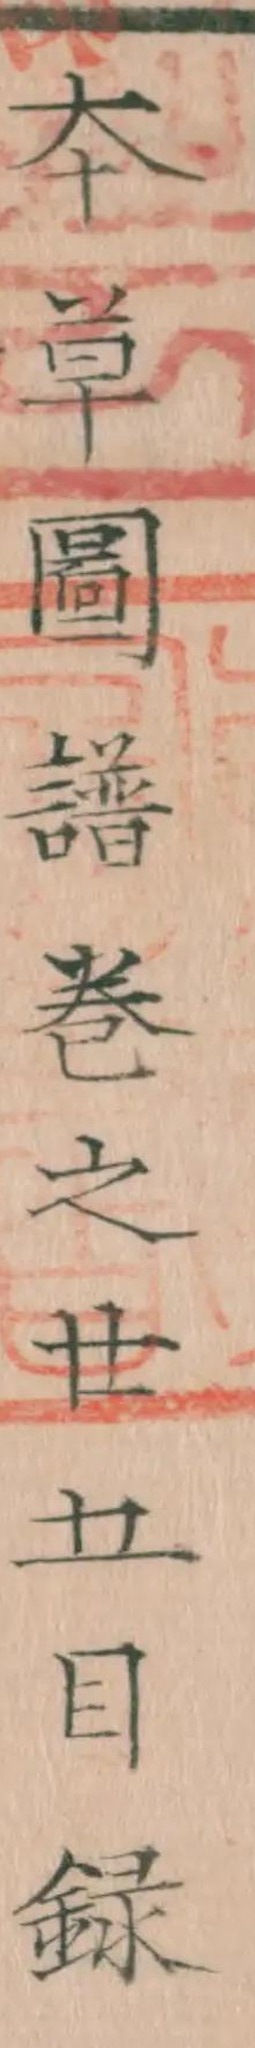本草図譜巻之廿五目録
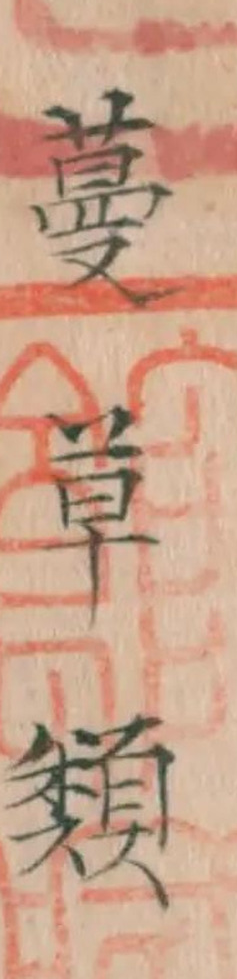蔓草類

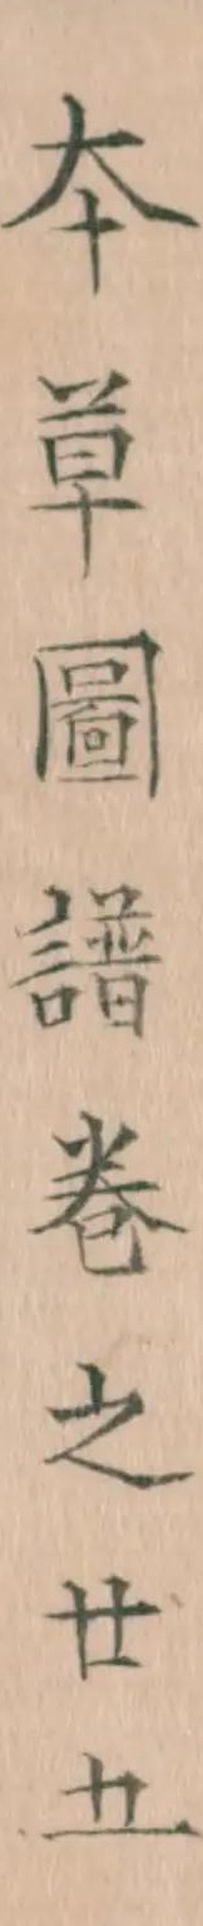本草図譜巻之廿五
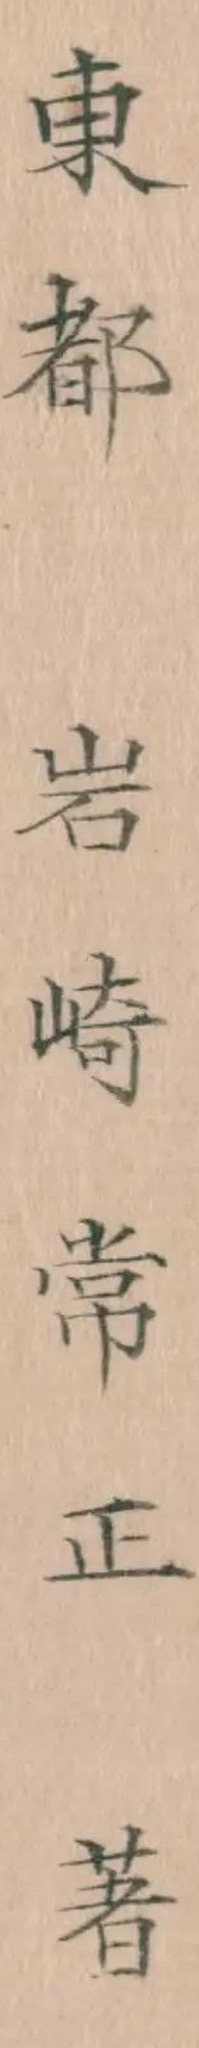東都岩崎常正著
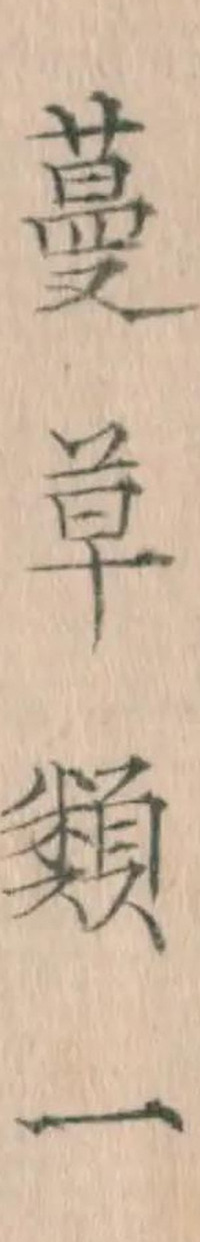蔓草類一

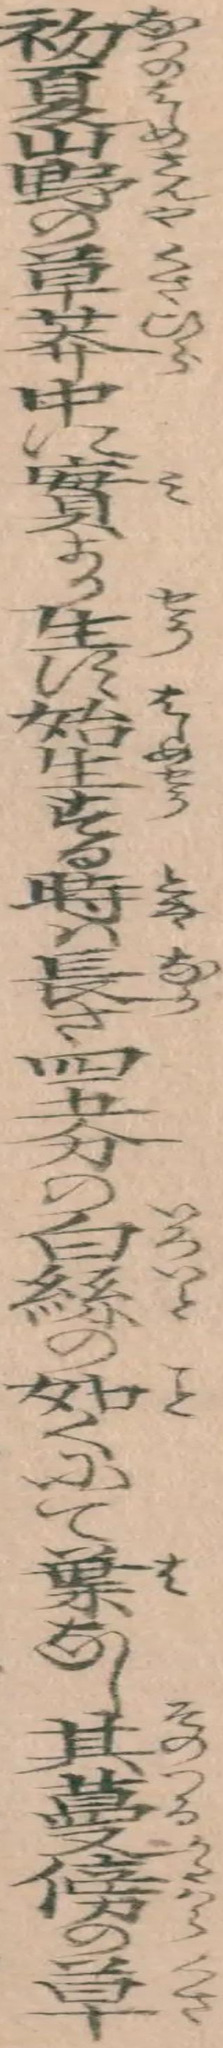初夏山野の草莽中に実より生す始生する時は長さ四五分の白糸の如くにて葉なし其蔓傍の草
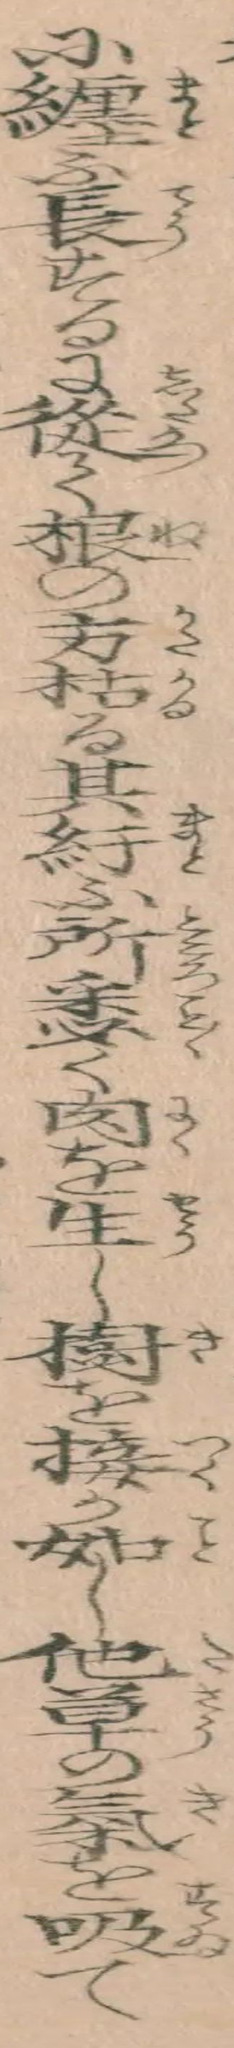に纏ふ長するに従て根の方枯る其紆ふ所悉く肉を生し樹を接か如し他草の気を吸て
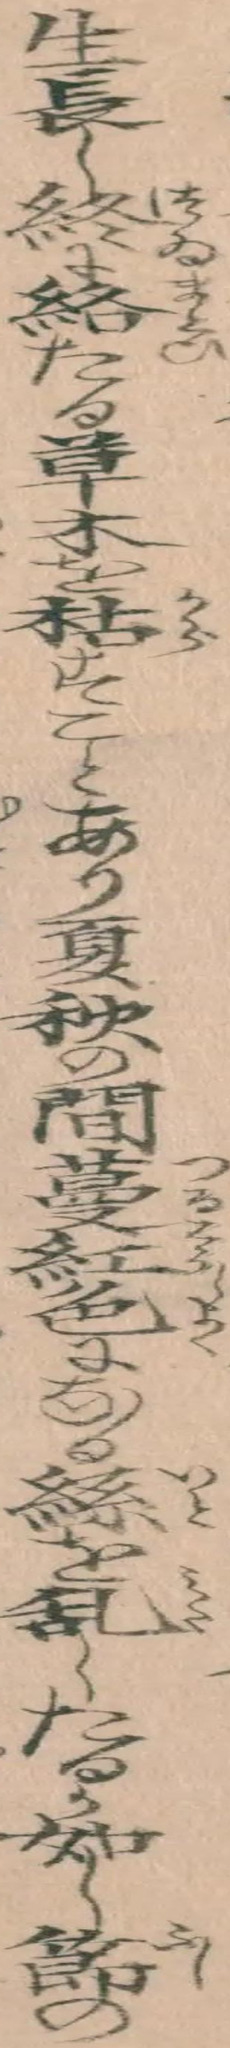生長し終に絡たる草木を枯すことあり夏秋の間蔓紅色になる糸を乱したるか如し節の
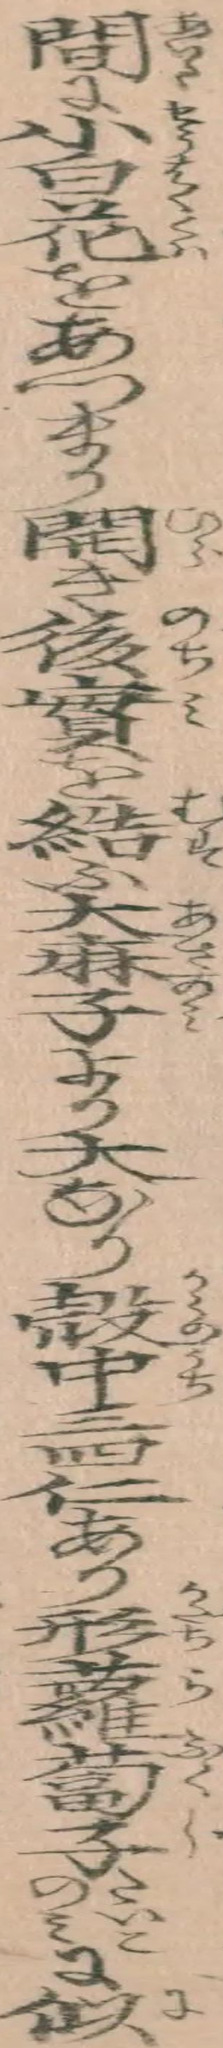間に小白花をあつまり開き後実を結ふ大麻子より大なり殻中三四仁あり形蘿蔔子たいこのみに似
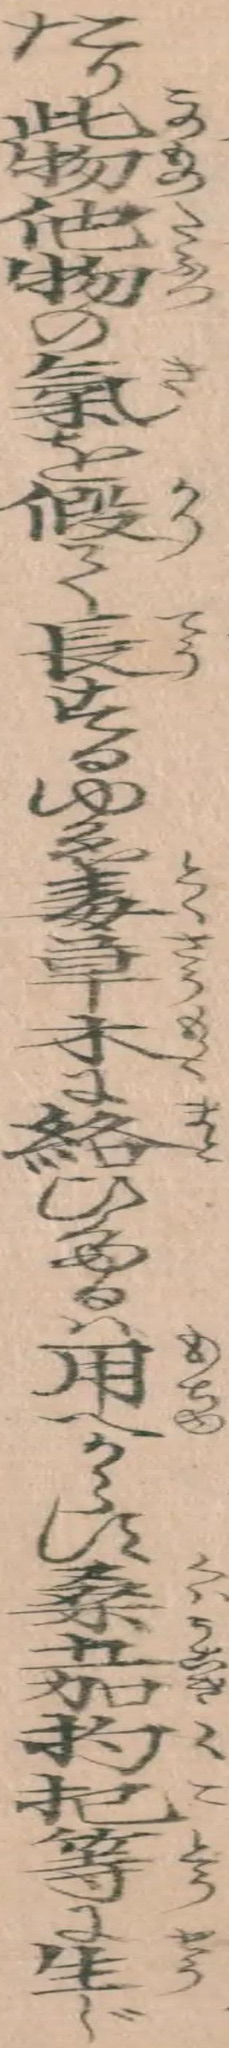たり此物他物の気を仮て長するゆゑ毒草木に絡ひたるは用へからす桑五加枸杞等に生じ
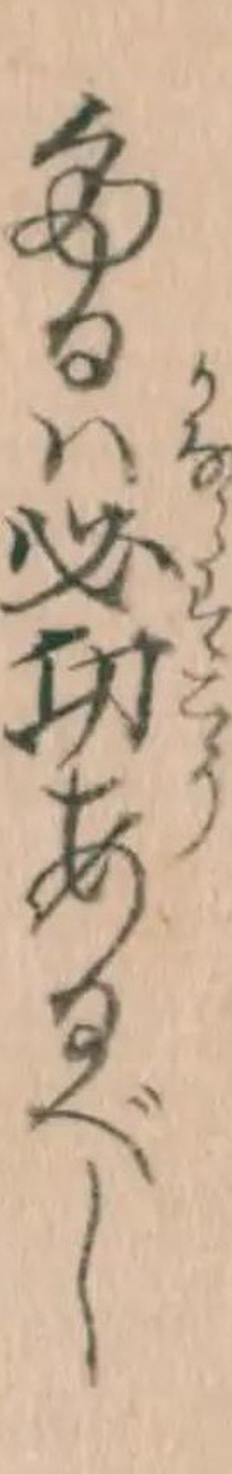たるは必功あるべし

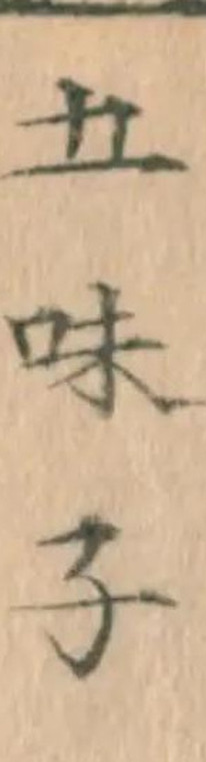五味子
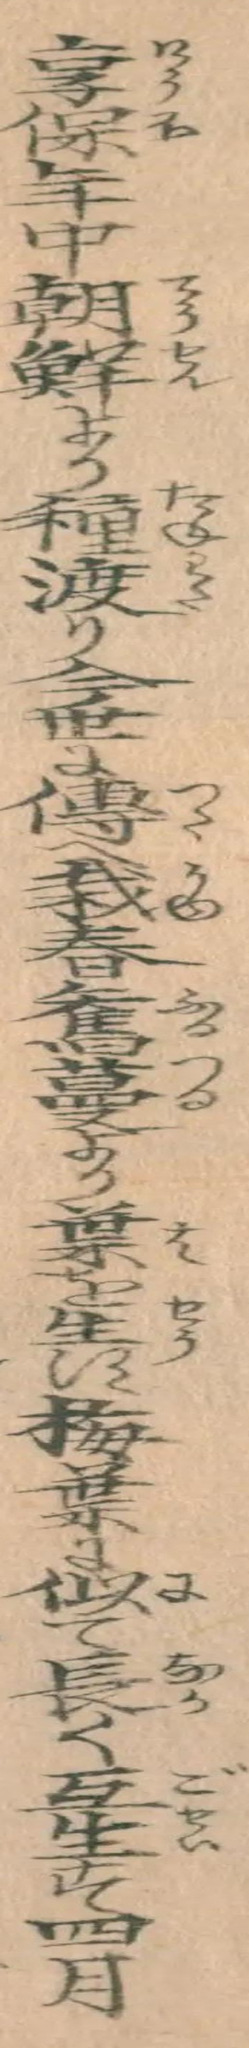享保年中朝鮮より種渡り今世に伝へ栽春旧蔓より葉を生す梅葉に似て長く互生す四月
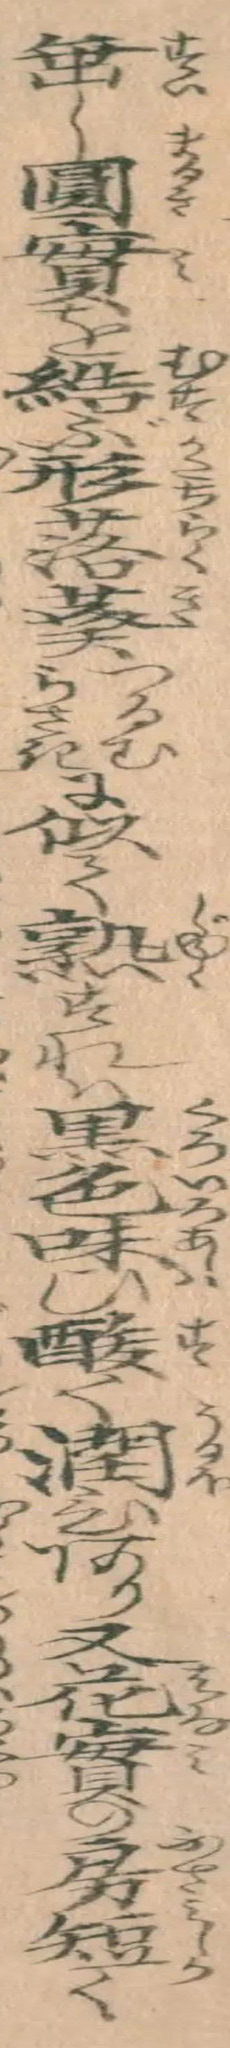垂し円実を結ぶ形落葵つるむらさきに似て熟すれは黒色味ひ酸く潤ひあり又花実の房短く
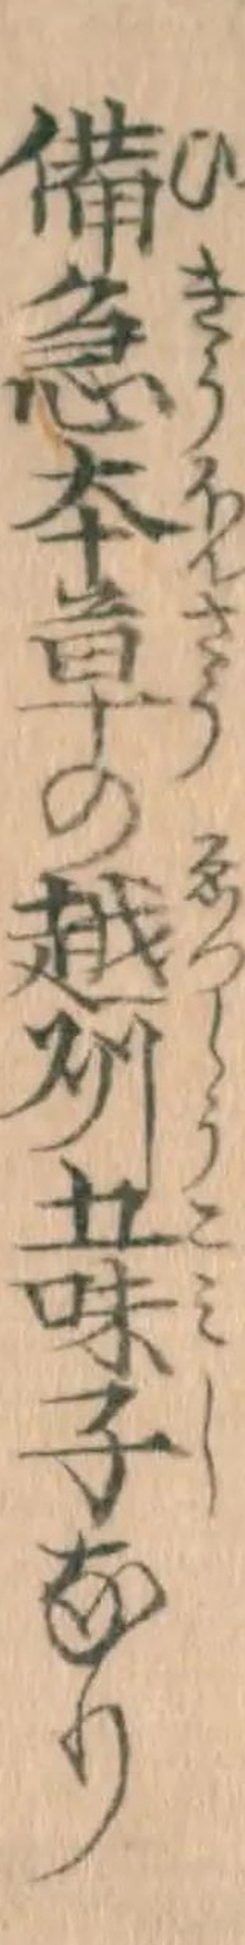備急本草の越州五味子なり
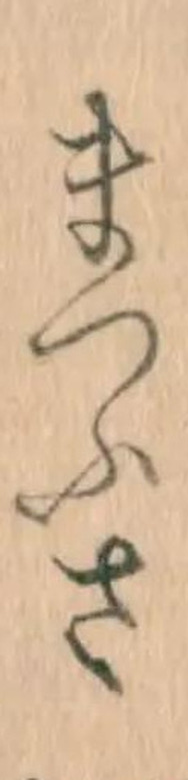まつふさ
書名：本草図譜. 巻25-27
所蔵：国立国会図書館 National Diet Library, JAPAN
